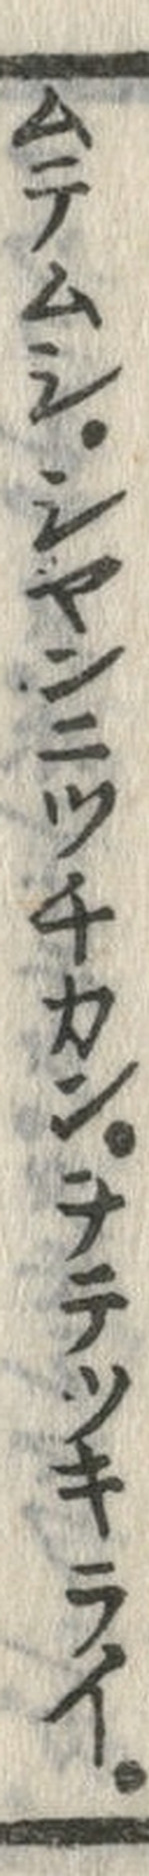ムテムシ。シヤンニツチカン。ヲテツキライ。
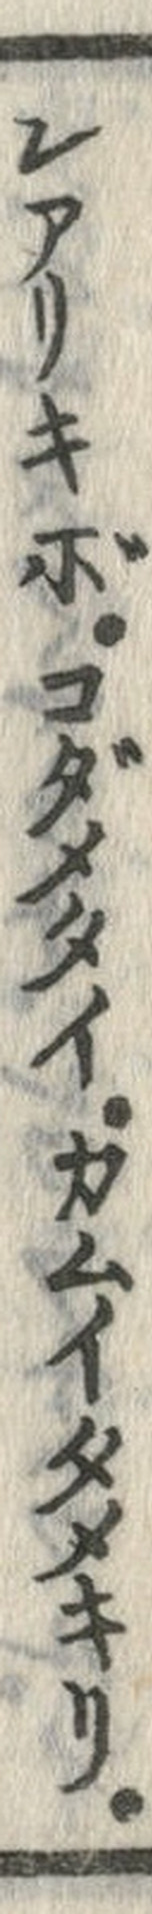シアリキボ。コダメタイ。カムイタメキリ。
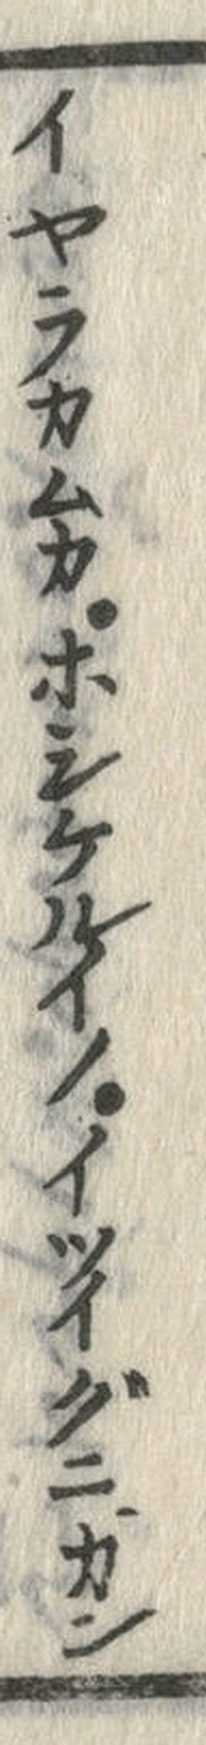イヤラカムカ。ホシケルイノ。イツイグニ。カン
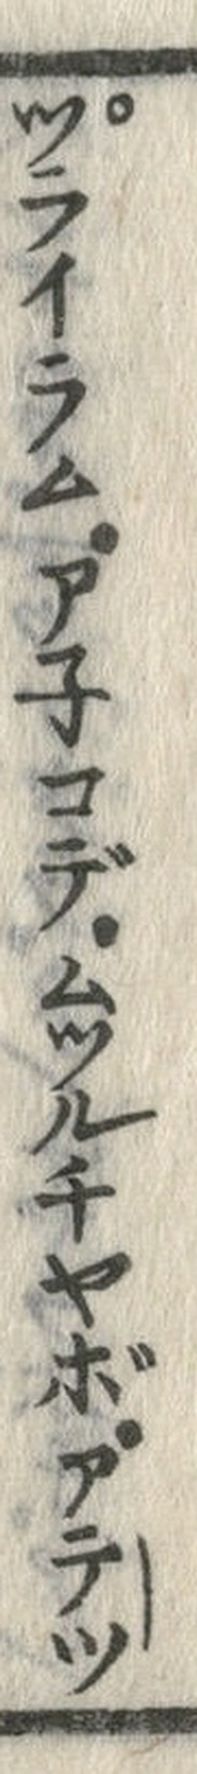ツ゚ライラム。アネコデ。ムツルチヤボ。アテツ
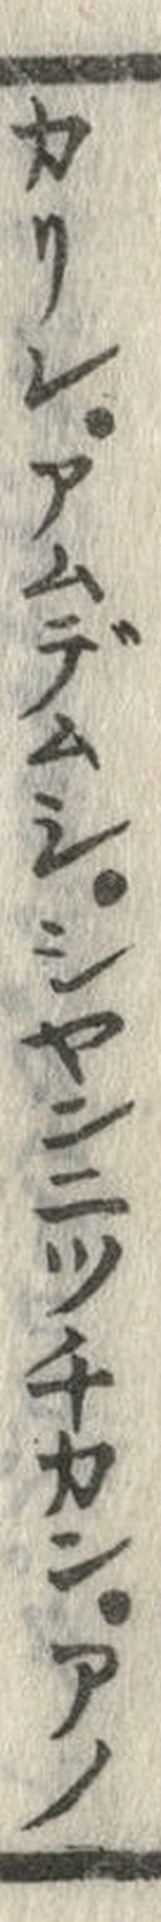カリレ。アムデムシ。シヤンニツチカン。アノ

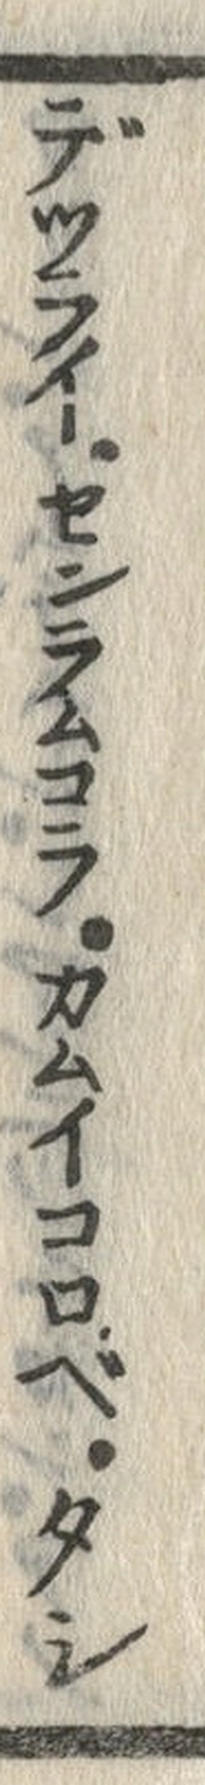デツライ。センラムコラ。カムイコロベ。タシ
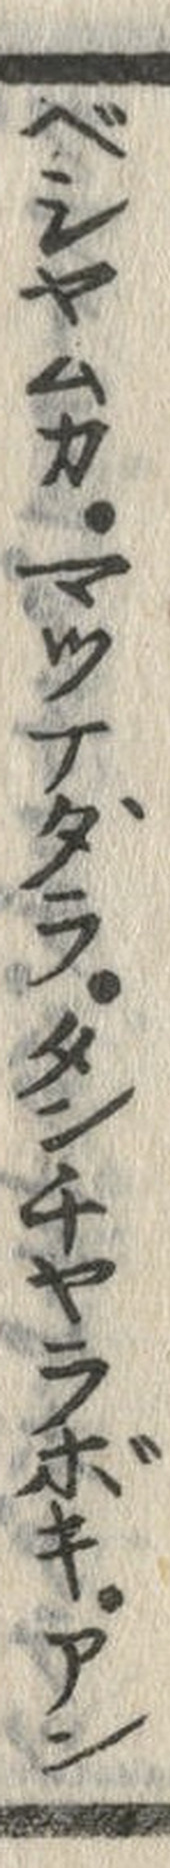ベシヤムカ。マツナダラ。タンチヤラボキ。アン
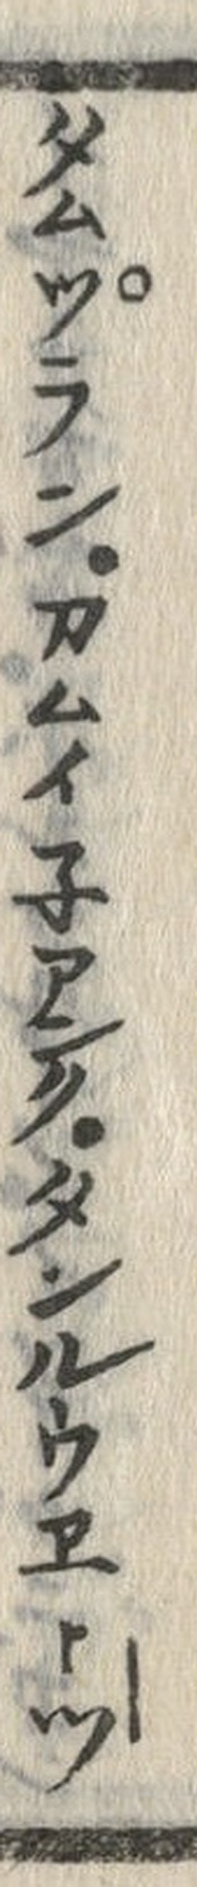タムツ゚ラン。カムイネアンク。タンルウヱトツ
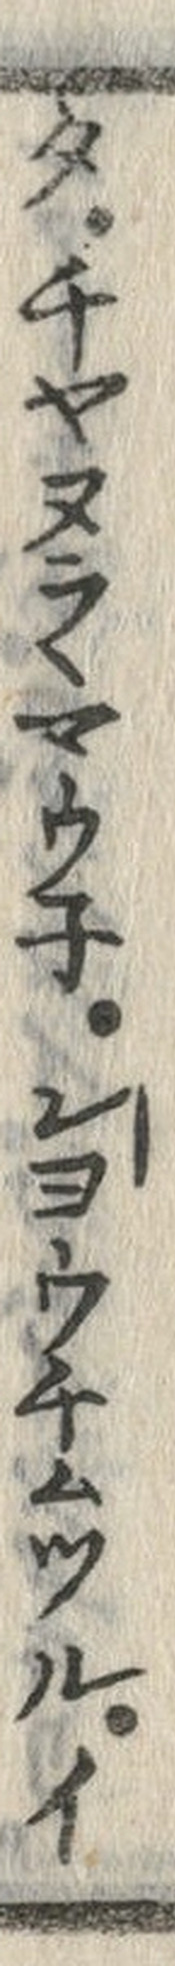タ。チヤヌラヽマウネ。シヨウチムツル。イ
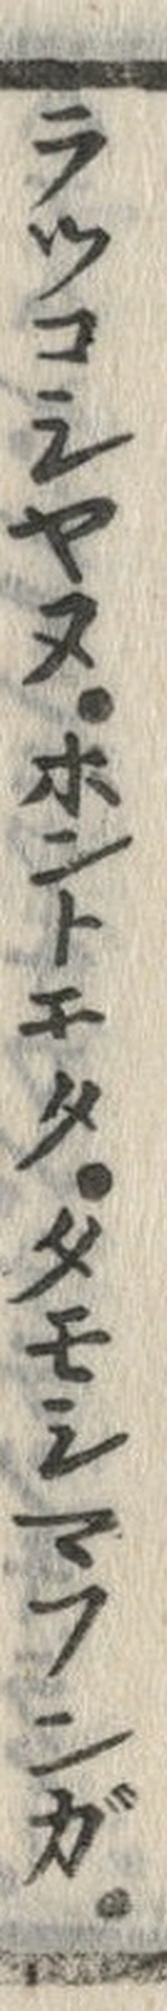ラツコシヤヌ。ホントモタ。タモシマフンガ。
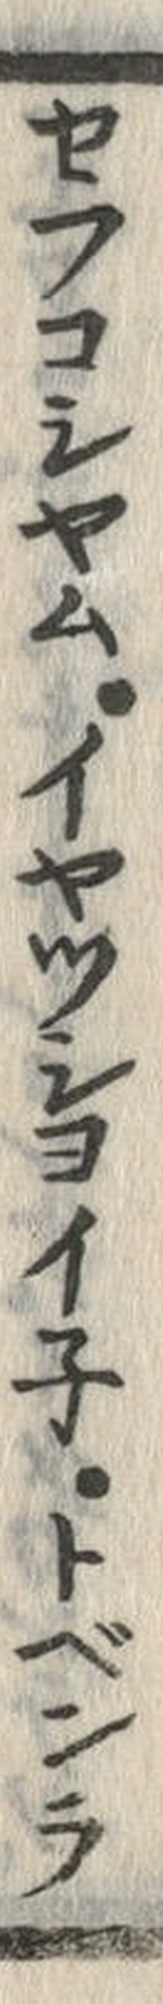セフコシヤム。イヤツシヨイネ。トベンラ
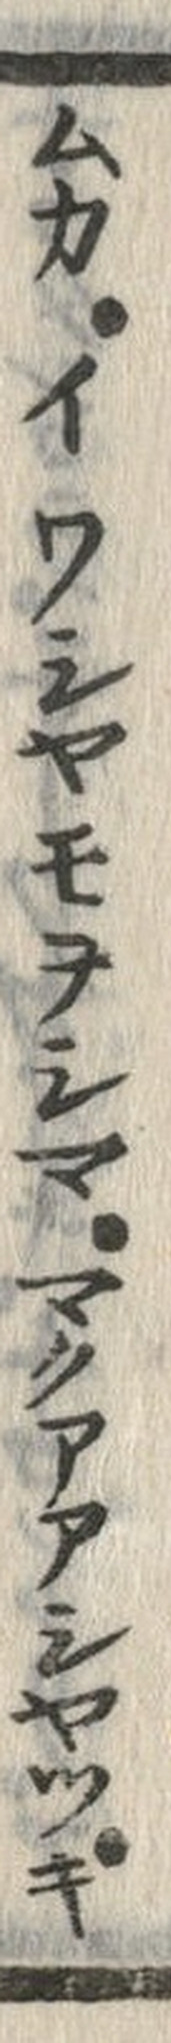ムカ。イワシヤモヲシマ。マクアアシヤツ。キ
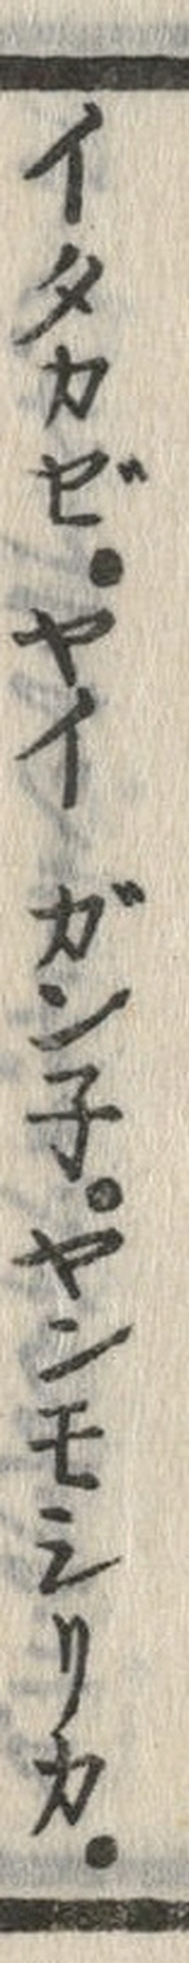イタカゼ。ヤイガンネ。ヤンモシリカ。

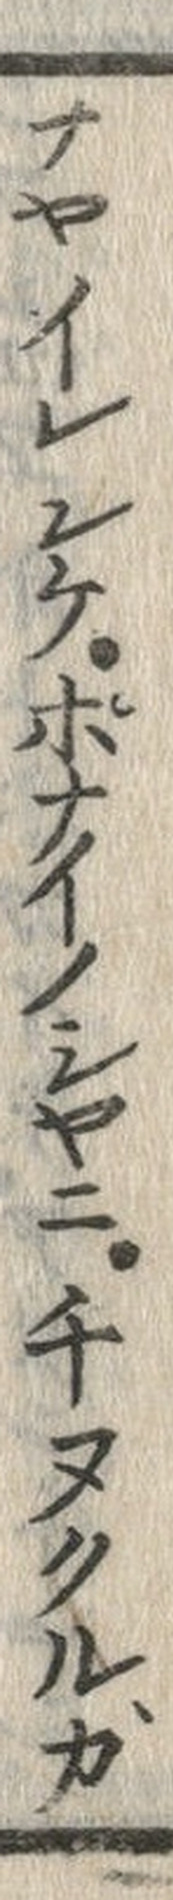ヲヤイレシケ。ポナイノシヤニ。チヌクルガ
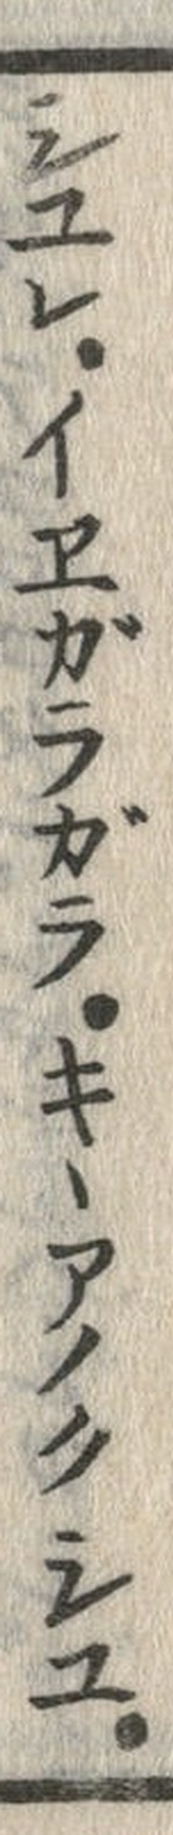シユレ。イヱガラガラ。キヽアノクシユ。
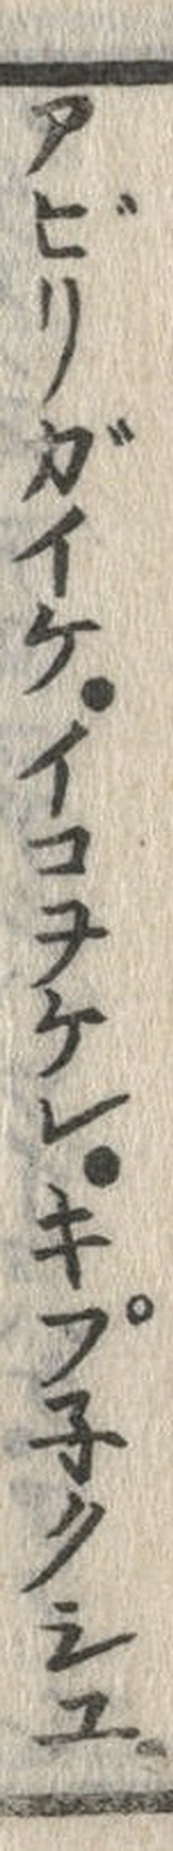アビリガイケ。イコヲケレ。キプネクシユ。
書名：蝦夷方言藻汐草　坤巻
